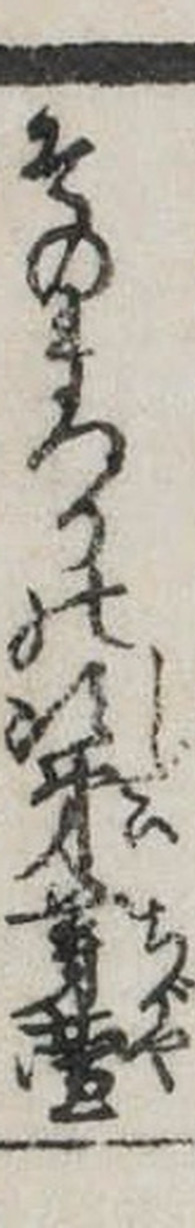そのまつりの次第茅萱
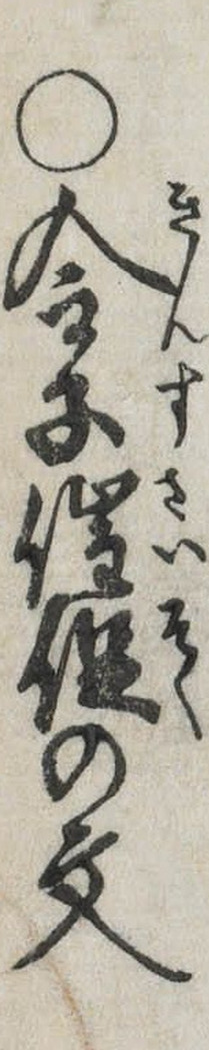○金子催促の文
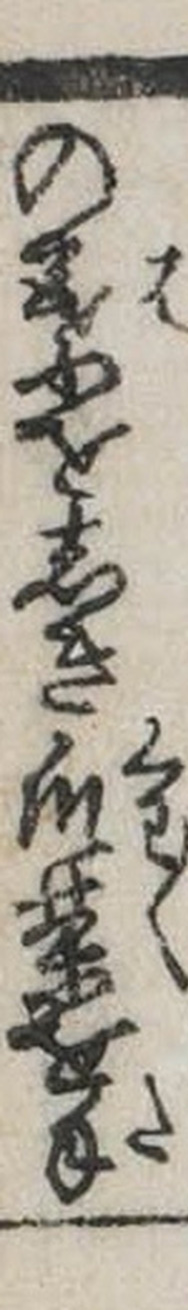の葉をしき瓜菓を手

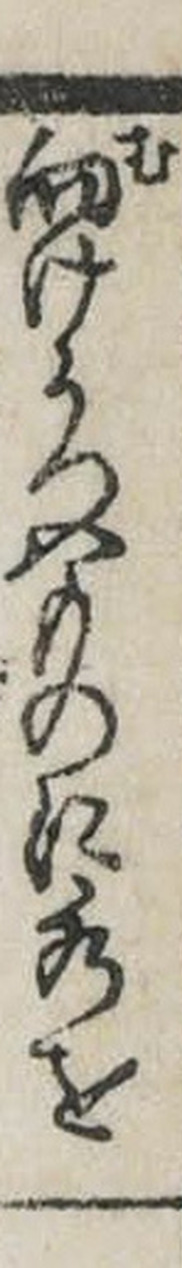向けうつはものに水を
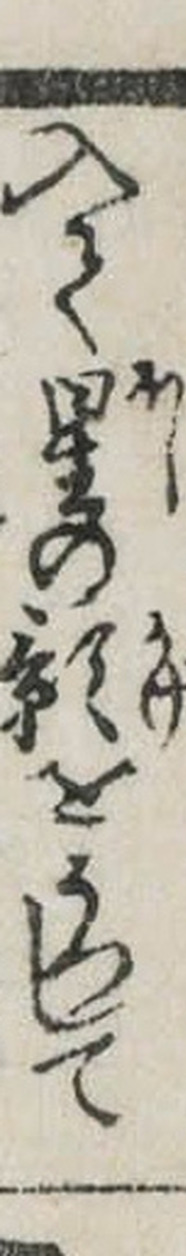入て星の影をうつして
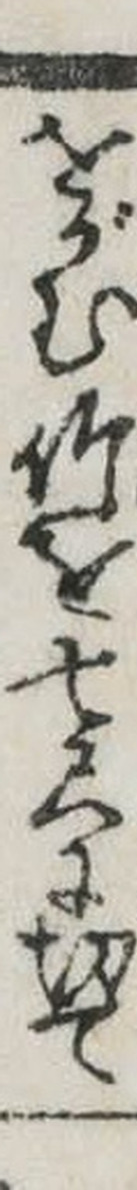をがむ竹を七尺に切て
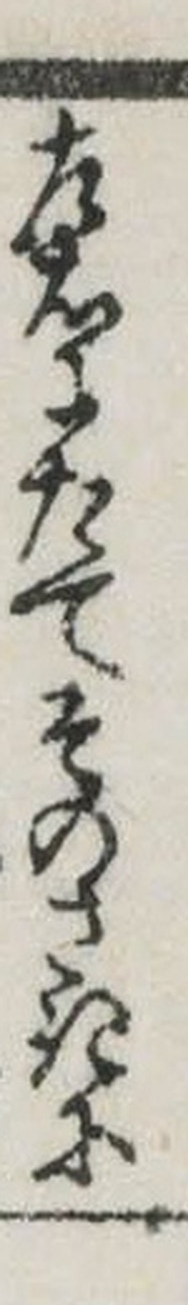左右にたてそのさきに
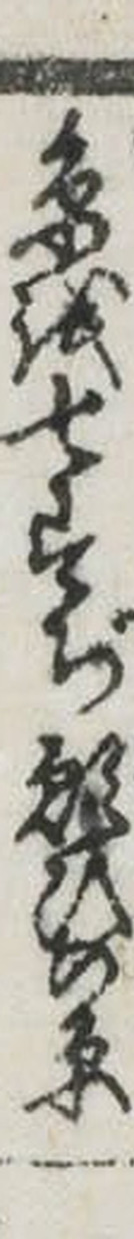糸を七すぢ願ひの糸
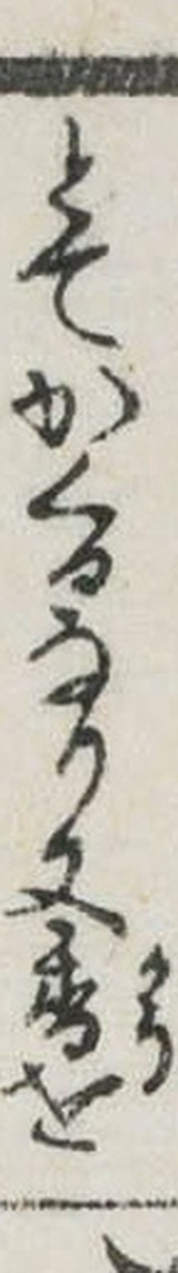とてかくるなり又香を
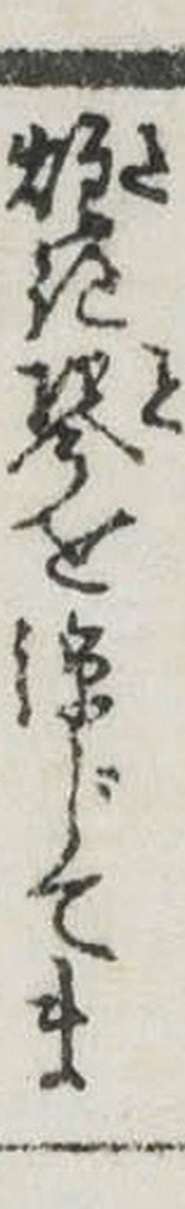炷き琴をじてま
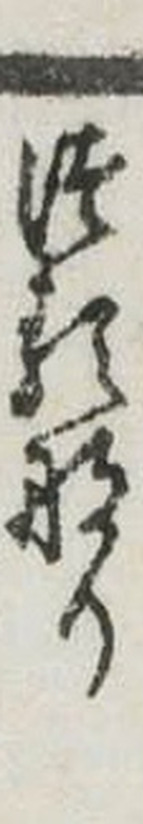つるなり
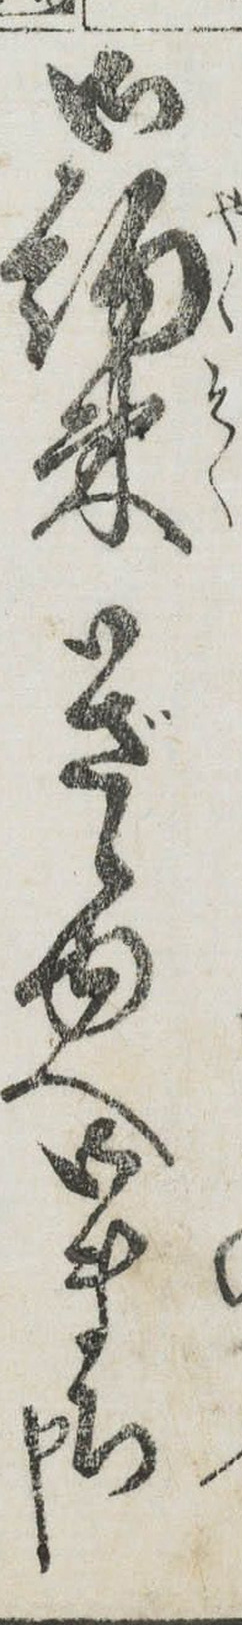御約束御ざ候ゆへ御まち申
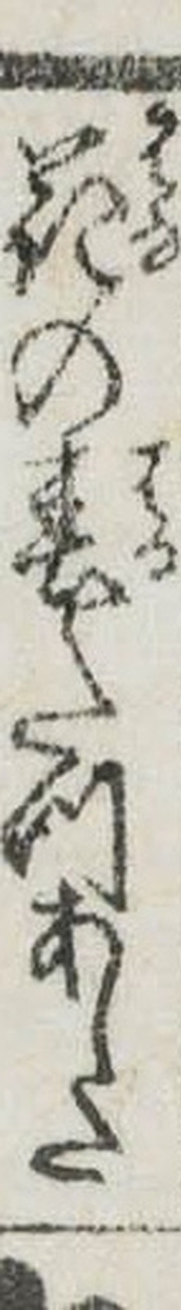花の春たつあした
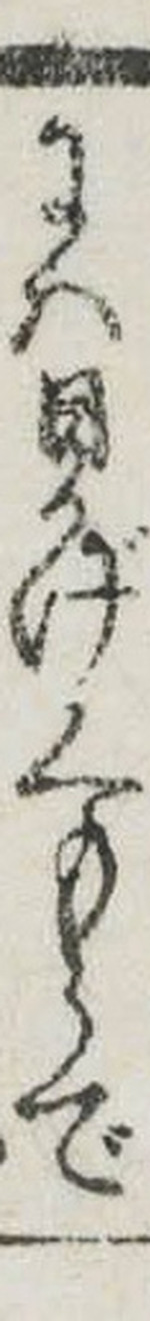には日かけくもらで
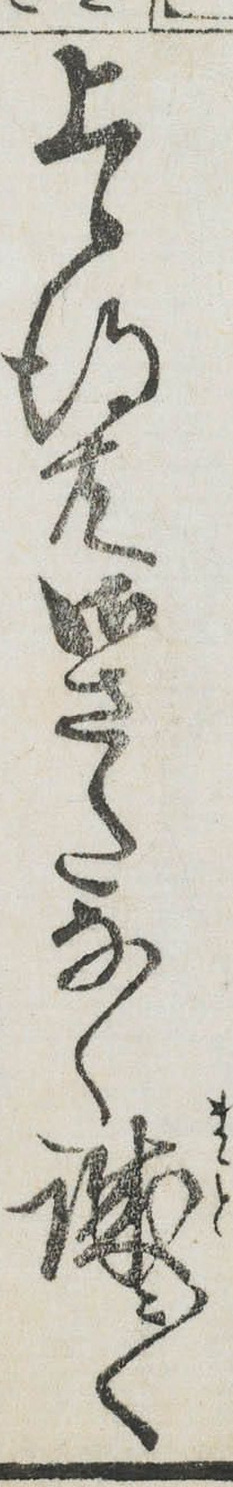上候得共御さたなく誠に〳〵
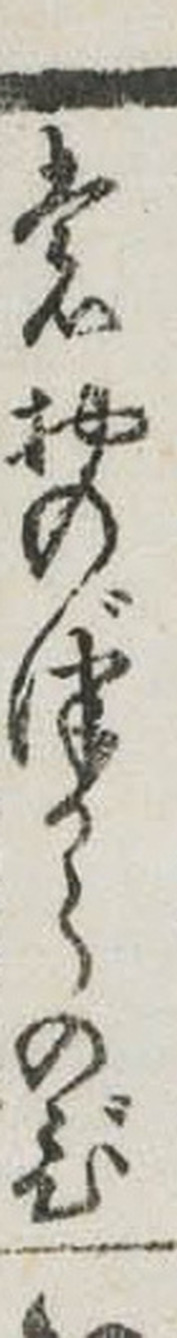おのづからのび
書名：頭書萬用婦人手紙之文言
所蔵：東京学芸大学教育コンテンツアーカイブ
